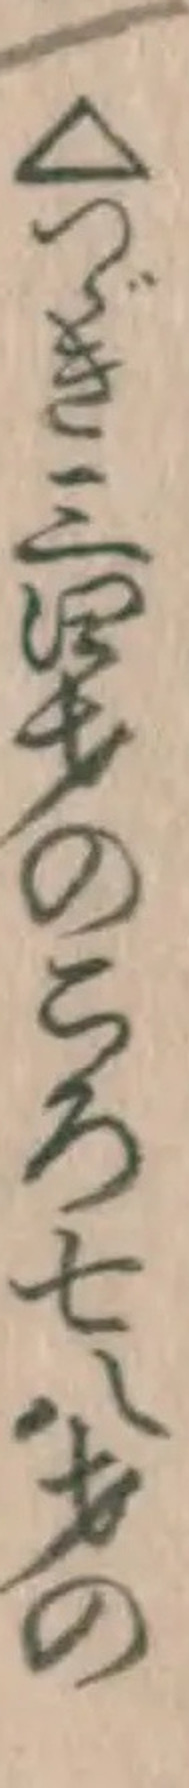△つゞき三四才のころ七八才の
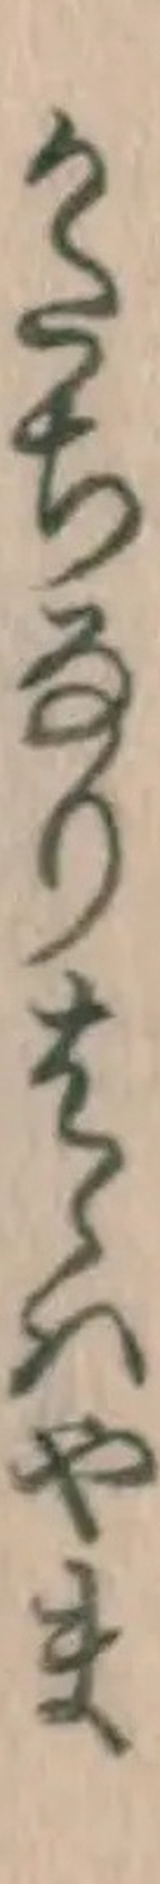かたちなりはゝはやま
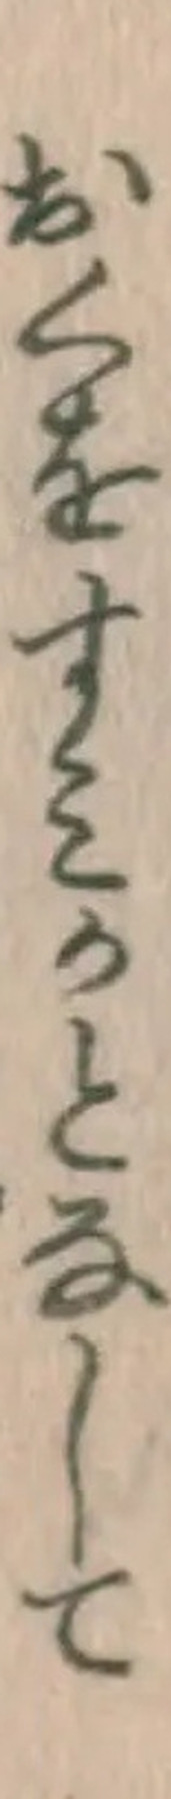おくをすみかとなして
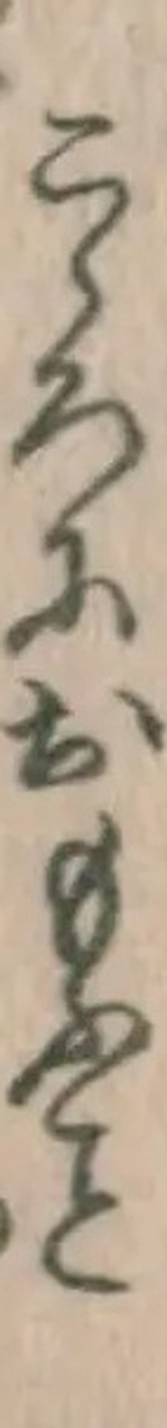こゝろにおもふこと
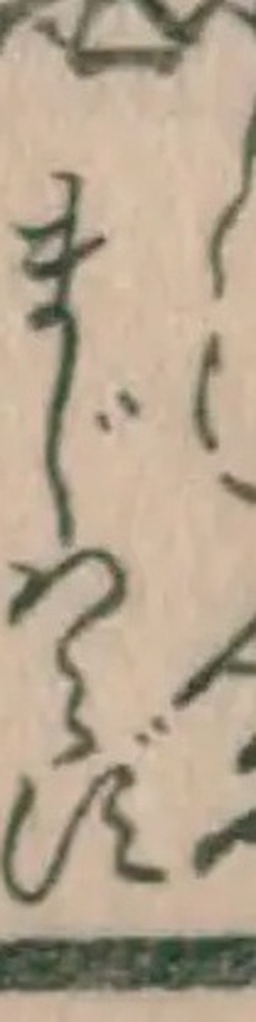まじはらず
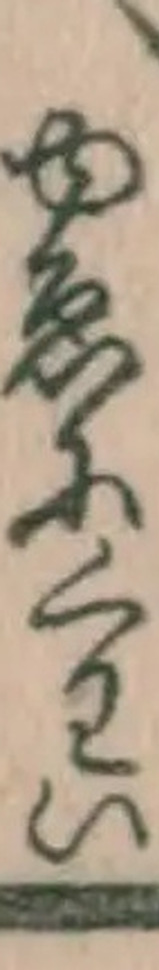ゆゑにくわい
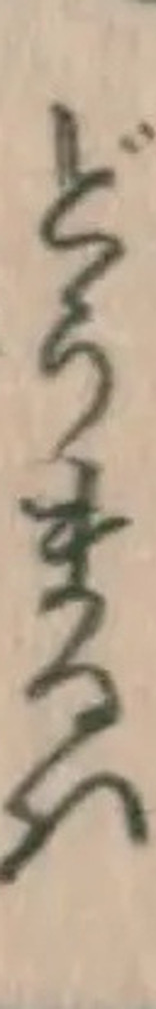どうまるは
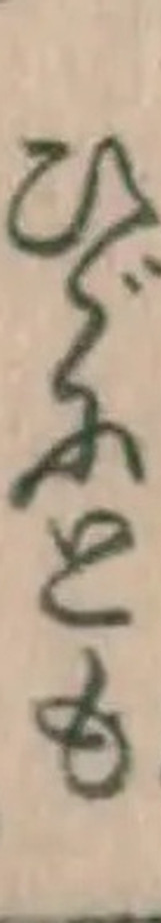ひゞにとも
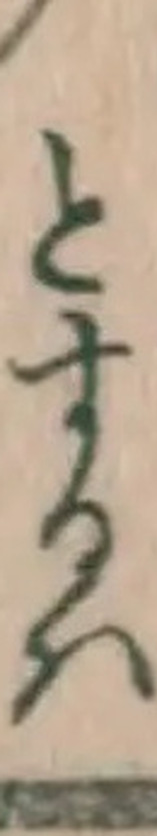とするは
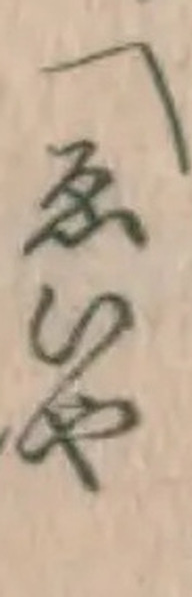〽ゑいや
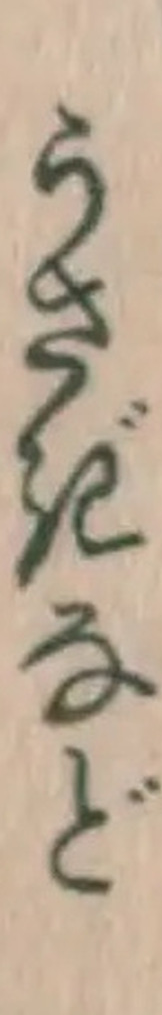うさぎなど
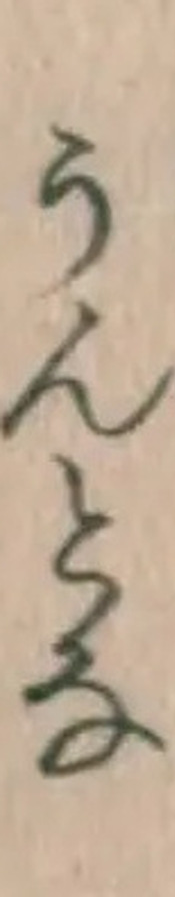うんとな
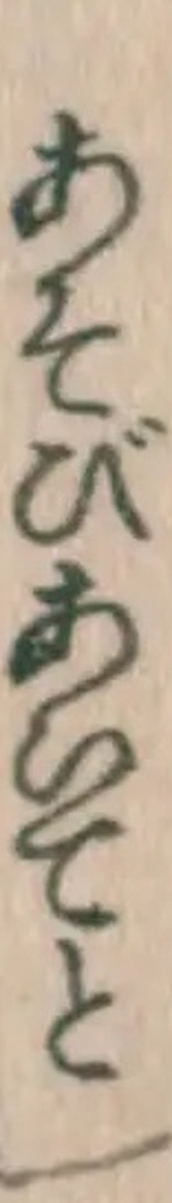あそびあいてと
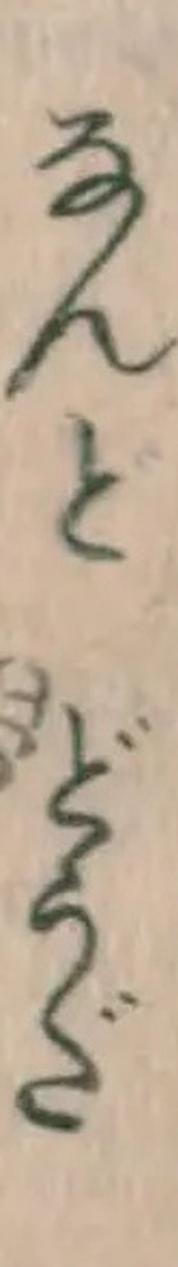なんとどうだ
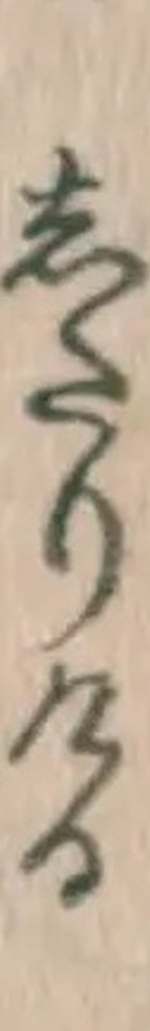したりける
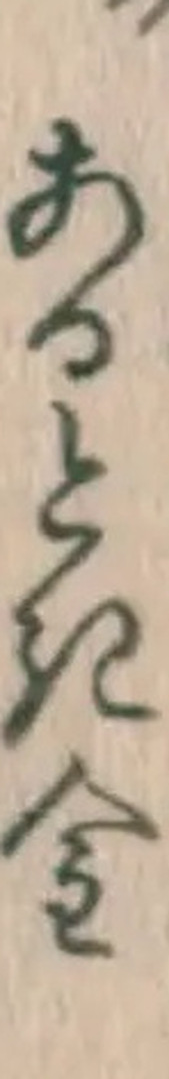あるとき金
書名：金太郎
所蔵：国立国会図書館 National Diet Library, JAPAN
